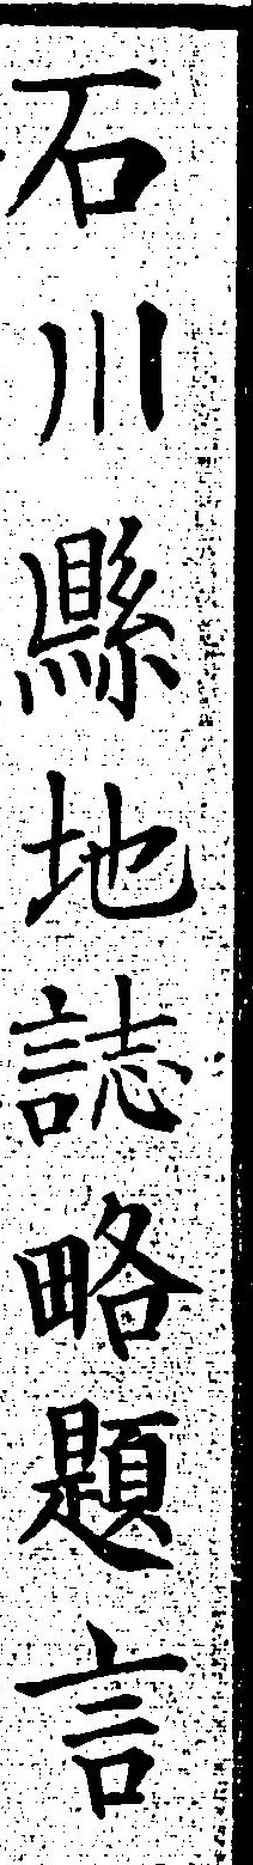石川県地誌略題言
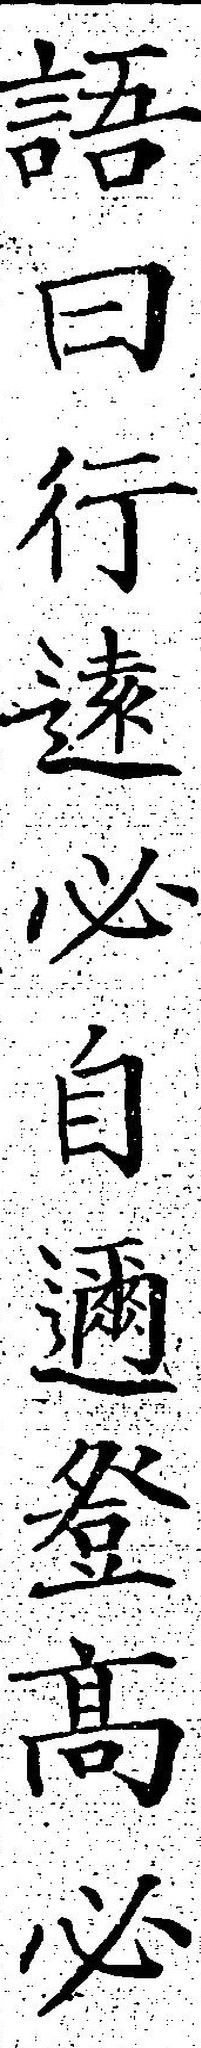語曰行遠必自邇登高必
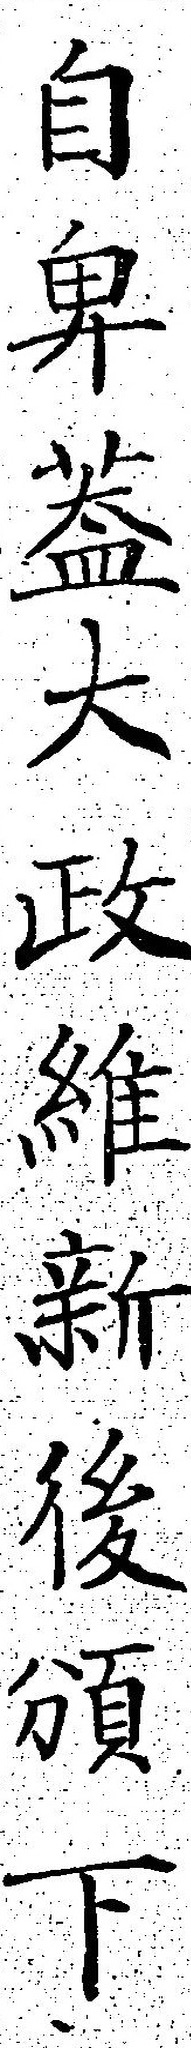自卑蓋大政維新後頒下
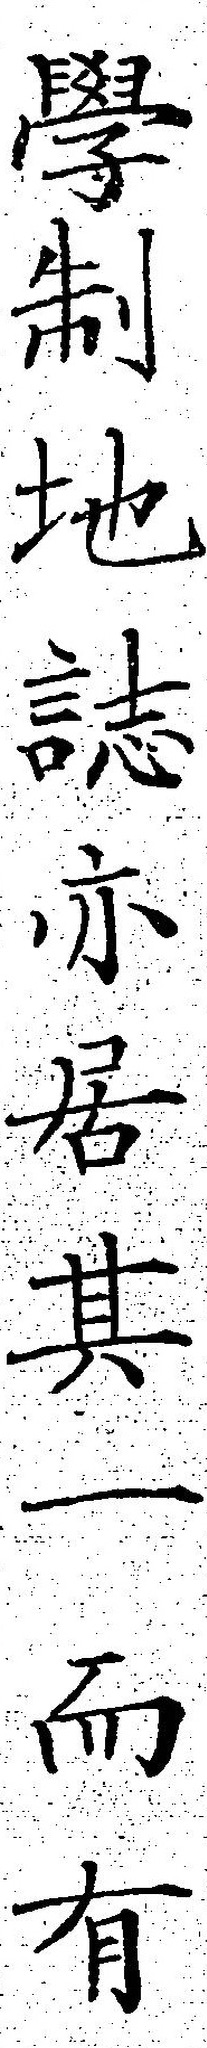学制地誌亦居其一而有
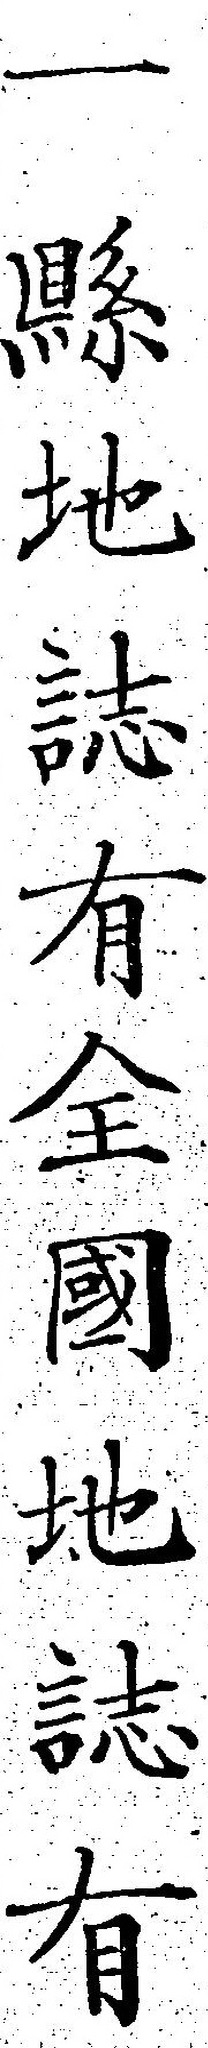一県地誌有全国地誌有
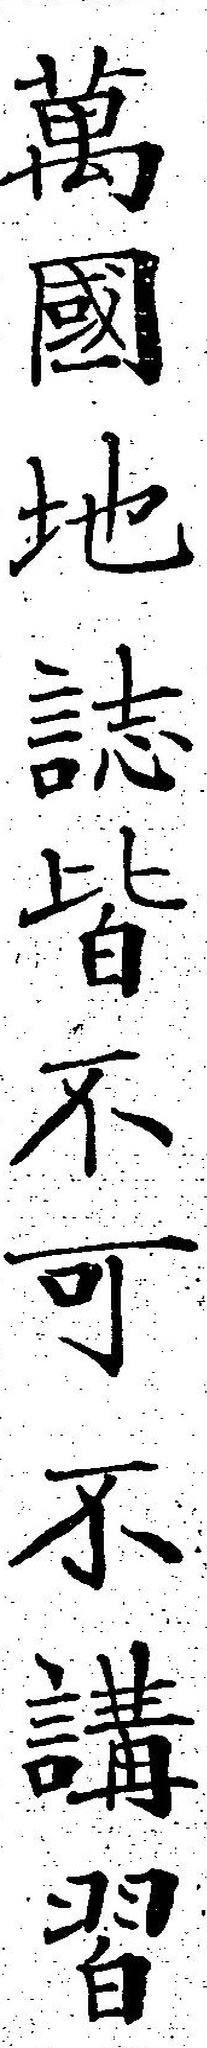万国地誌皆不可不講習
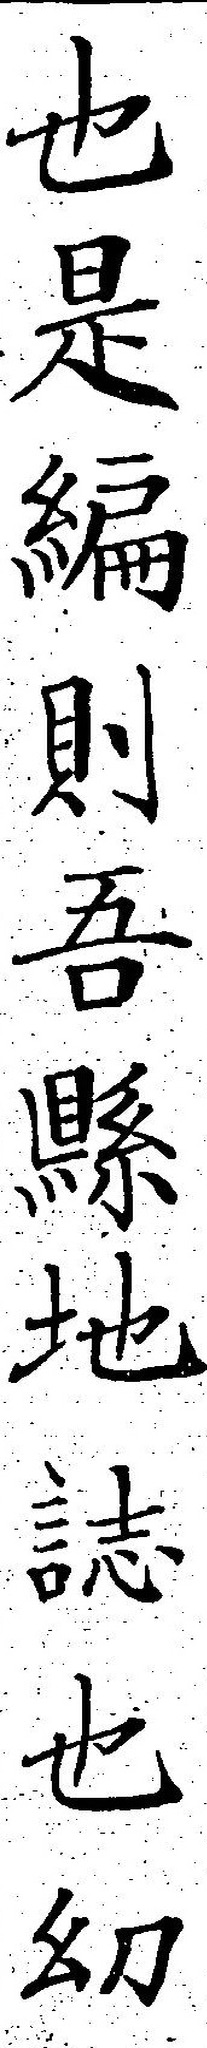也是編則吾県地誌也幼
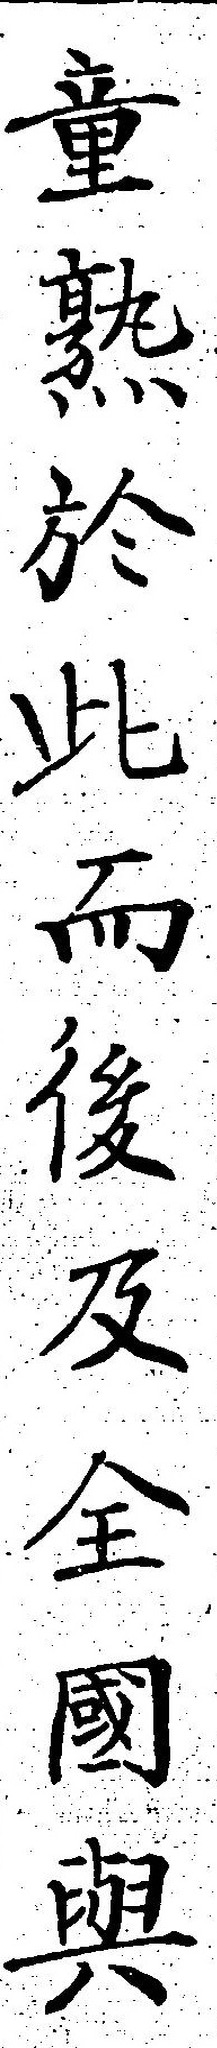童熟於此而後及全国与

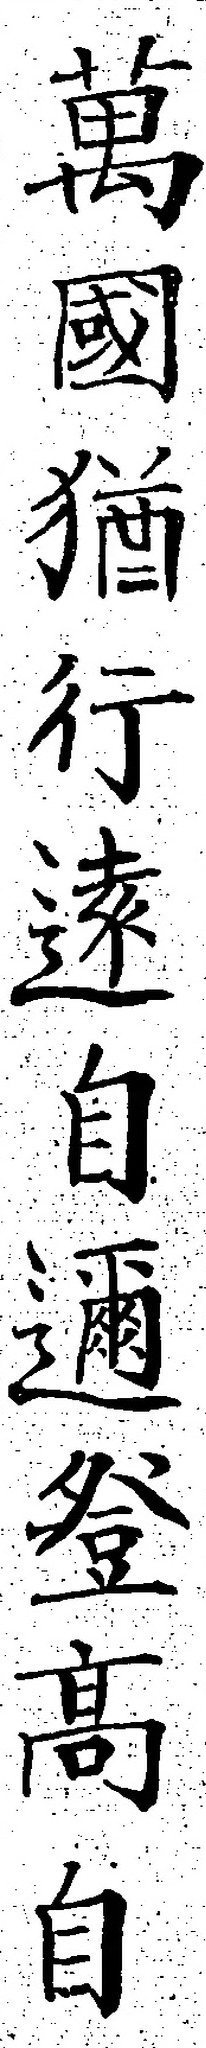万国猶行遠自邇登高自
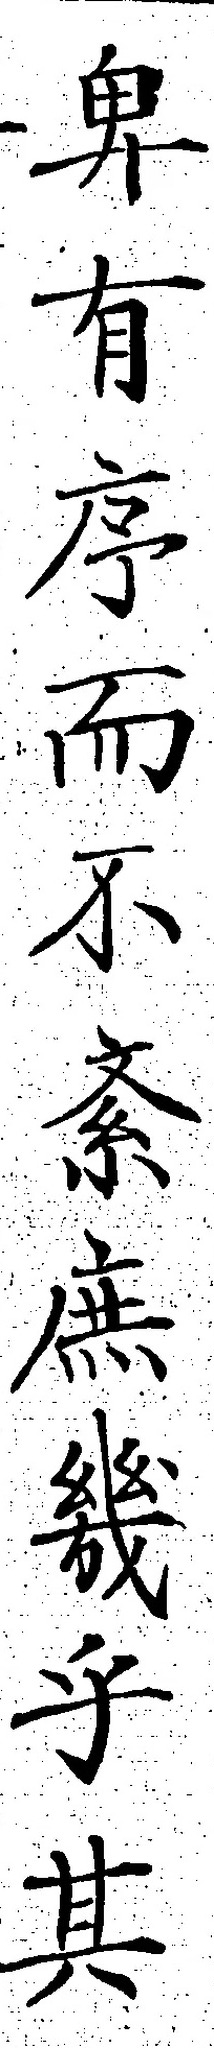卑有序而不紊庶幾乎其
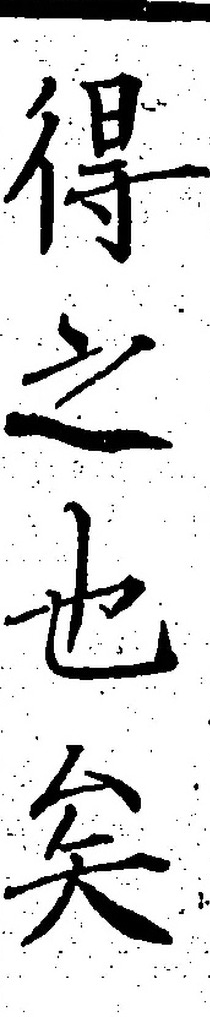得之也矣
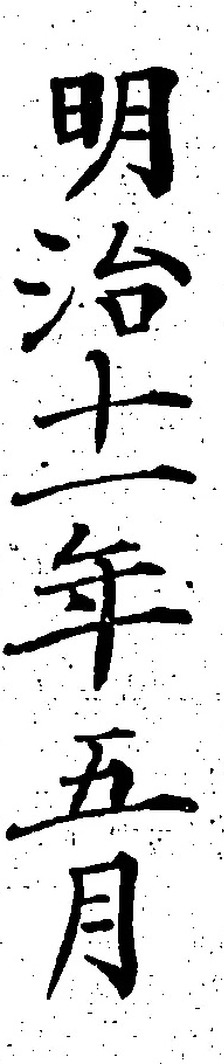明治十一年五月
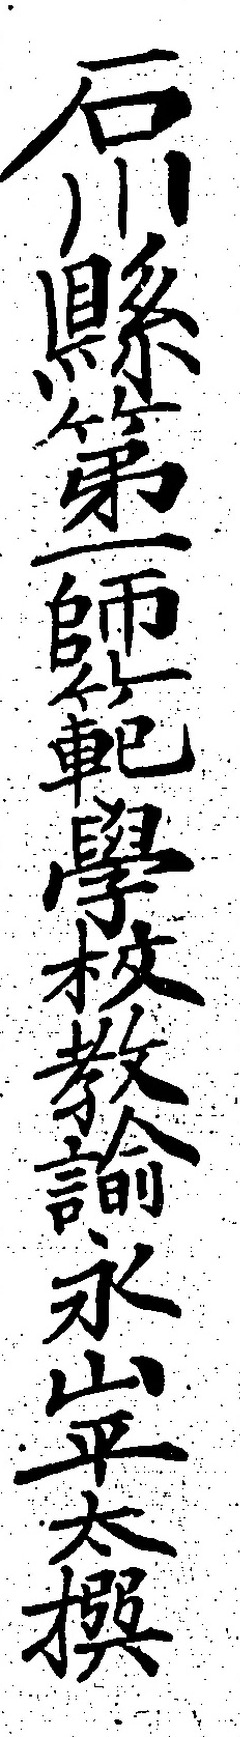石川県第一師範学校教諭永山平太撰

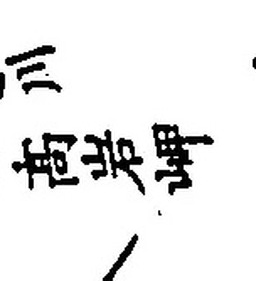高岩岬
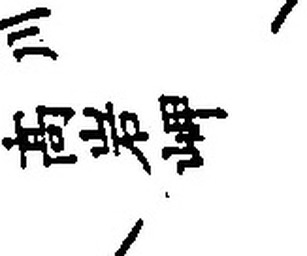高岩岬
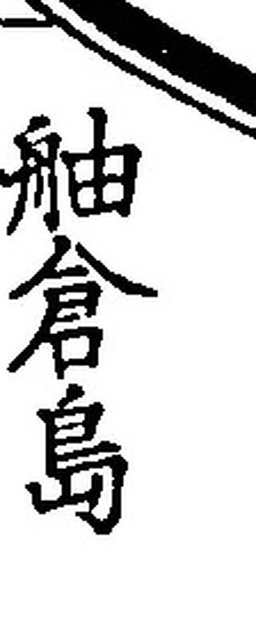舳倉島
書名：能登地誌略
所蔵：国立国会図書館 National Diet Library, JAPAN
